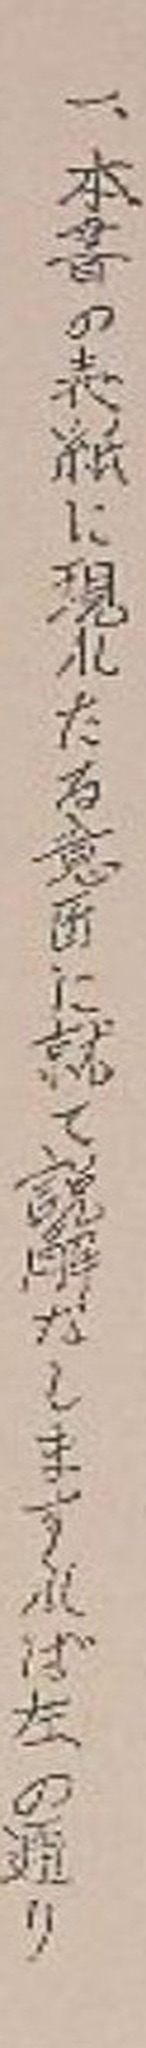一．本書の表紙に現れたる意図について説解なしますれば左の通り
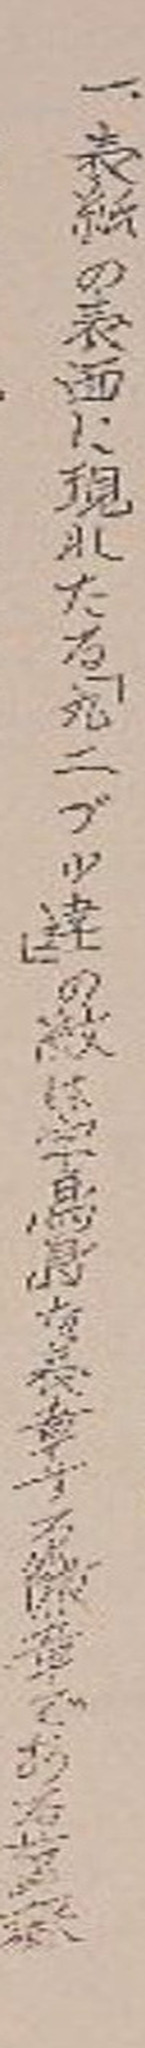一．表紙の表面に現れたる「丸にぶっ違」の紋は字鳥島を表章する徽章である藩政
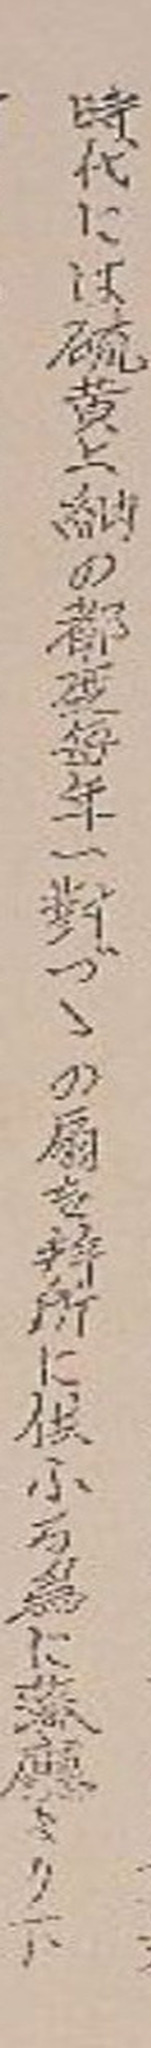時代には硫黄上納の都度毎年一対づゝの扇を弁所に供ふる為に藩庁より下
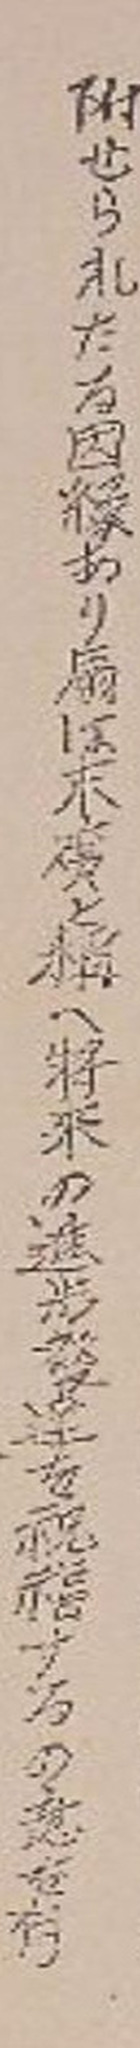附せられたる因縁あり扇は末広と称へ将来の進歩発達を祝福するの意を有
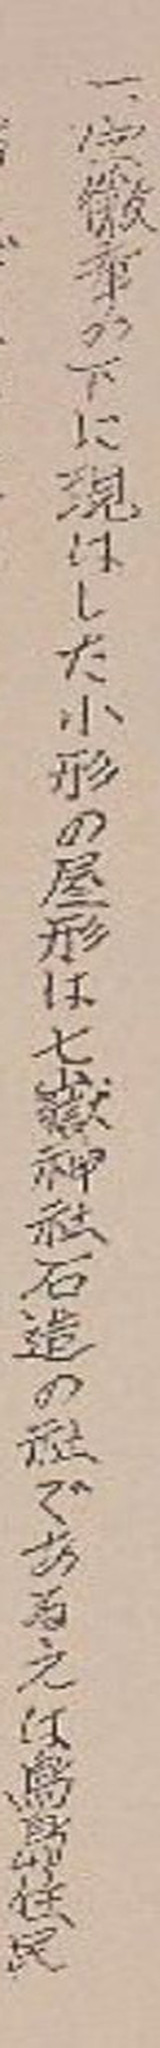一．字徽章の下に現はした小形の屋形は七嶽神社石造の社である之は鳥島住民
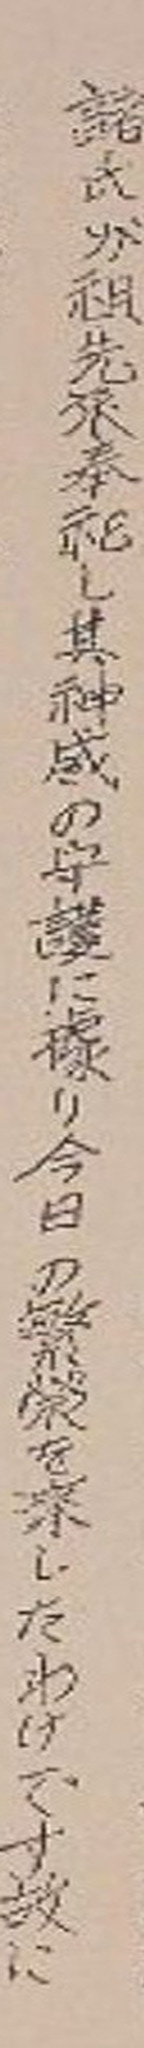諸氏が祖先来奉祀し其神威の守護に拠り今日の繁栄を来したわけです故に
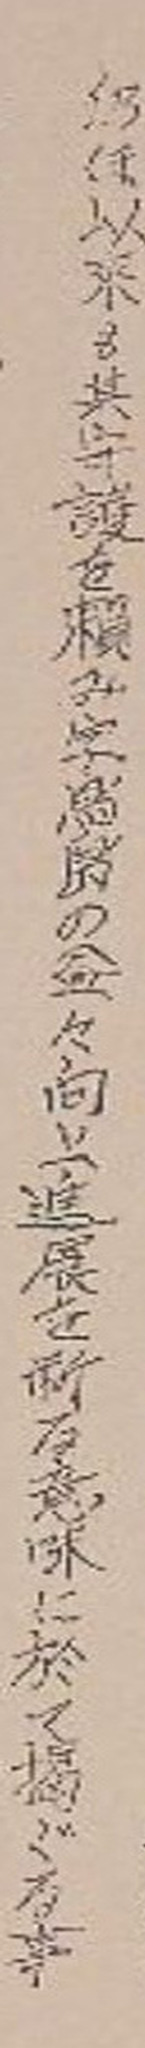移住以来も其守護を頼み字鳥島の益々向上進展を祈る意味に於て掲ぐる事
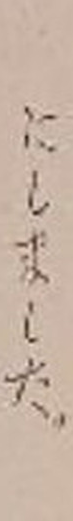にしました
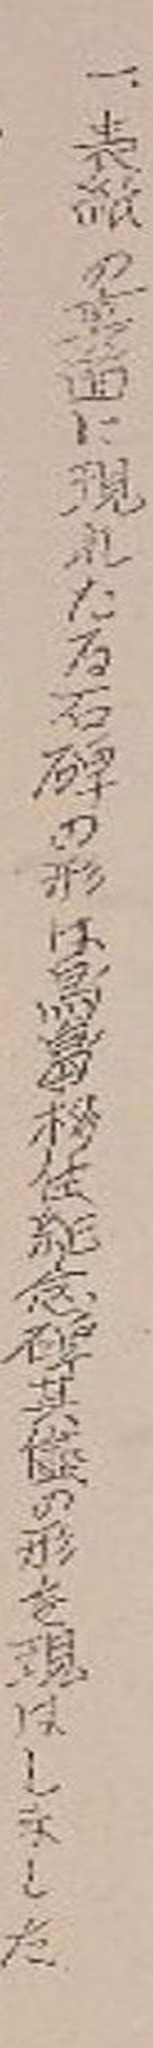一．表紙の裏面に現れたる石碑の形は鳥島移住紀念碑其侭の形を現はしました
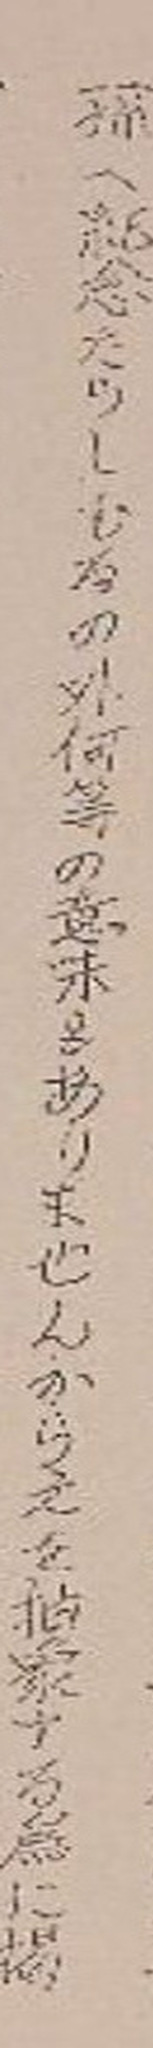孫へ紀念たらしむるの外何等の意味もありませんから之を抽象する為に掲
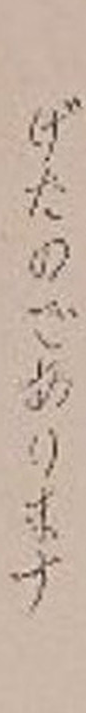げたのであります

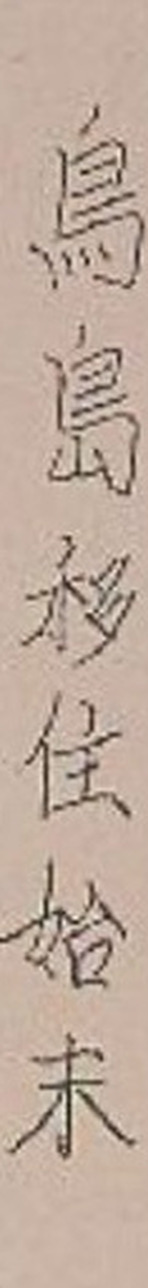鳥島移住始末
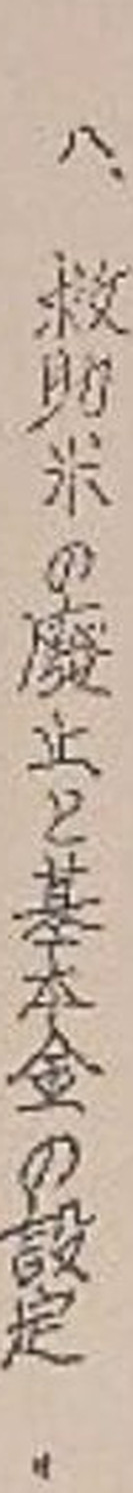ハ救助米の廃止と基本金の設定……八
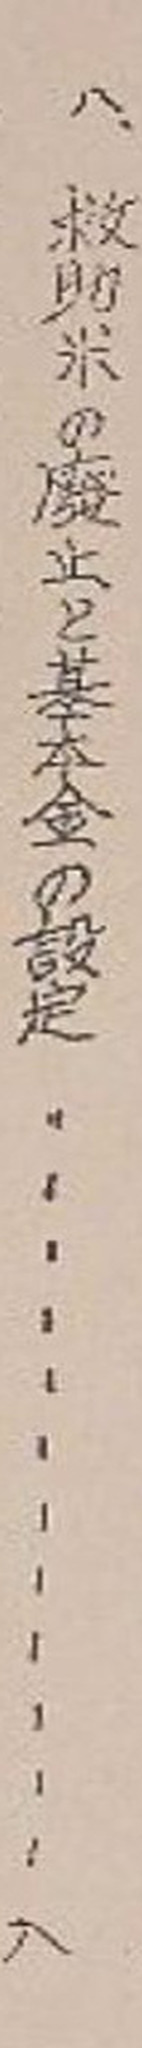ハ救助米の廃止と基本金の設定……八

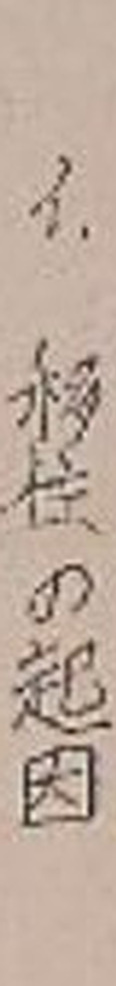イ移住の起因
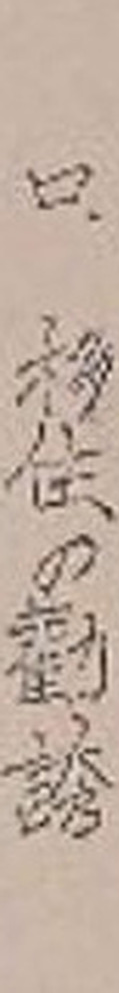ロ移住の勧誘
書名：鳥島移住始末
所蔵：University of the Ryukyus Library
